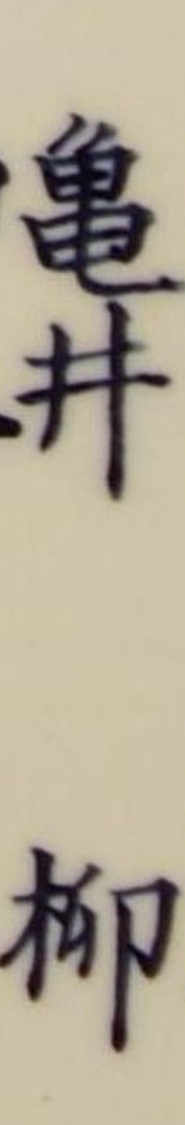亀井柳
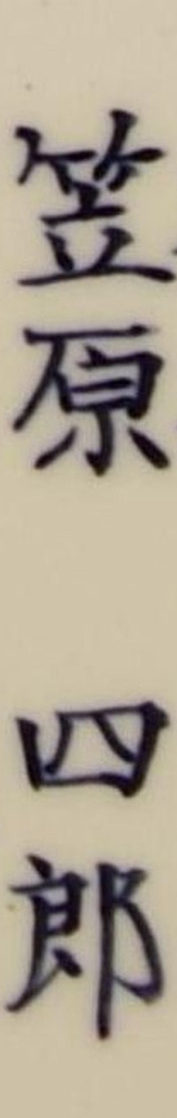笠原四郎
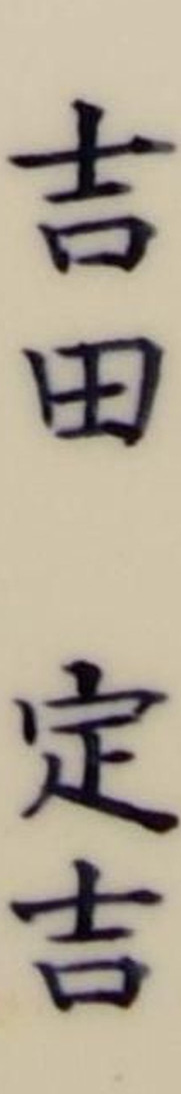吉田定吉
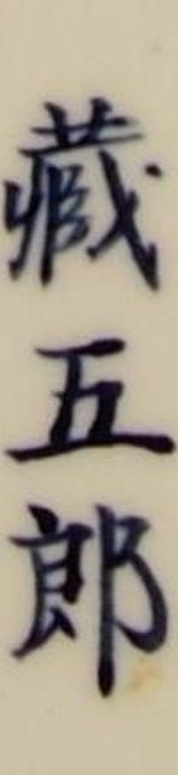蔵五郎
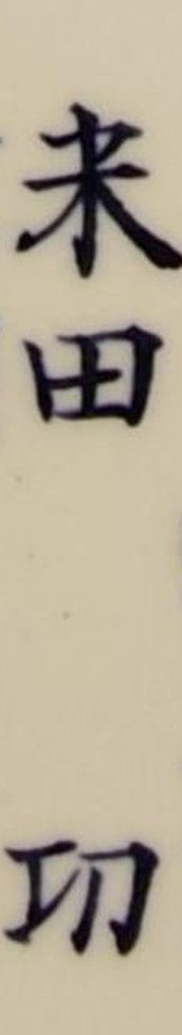米田功
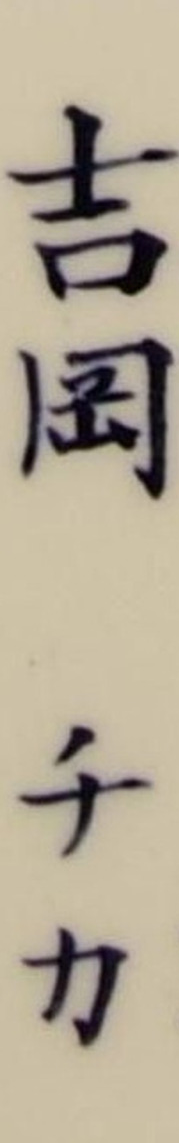吉岡チカ
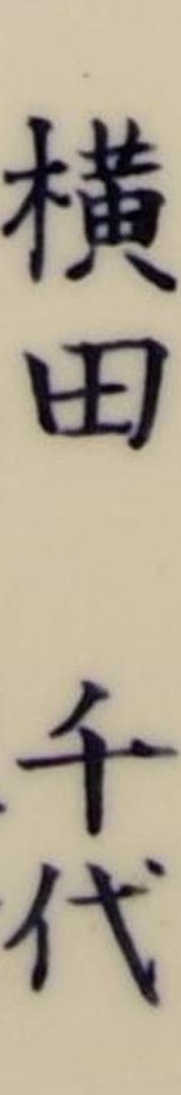横田千代
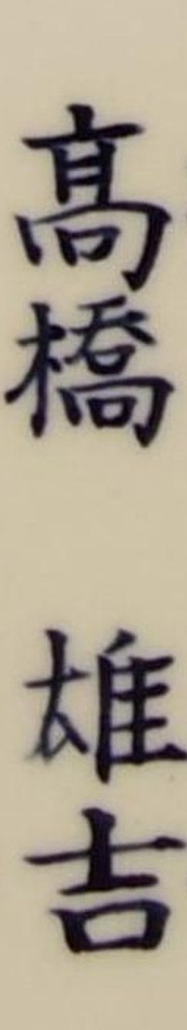高橋雄吉
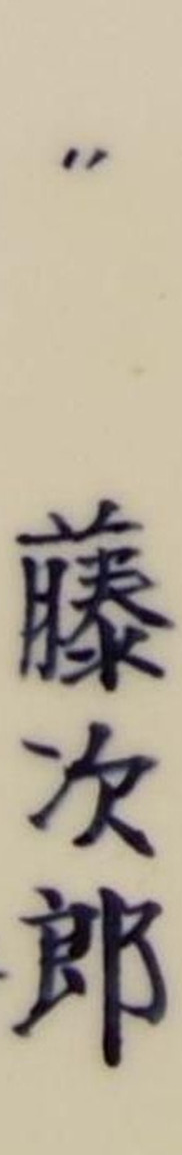藤次郎
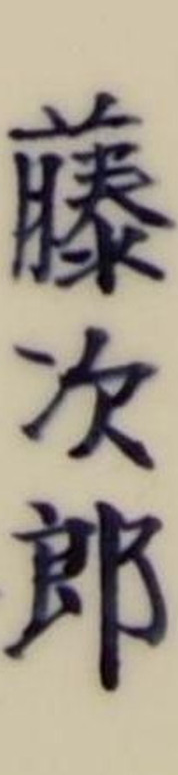藤次郎
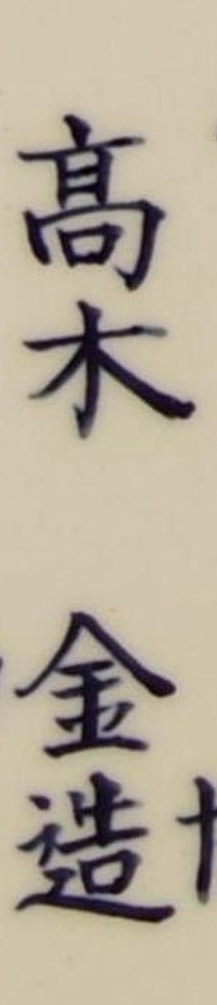高木金造
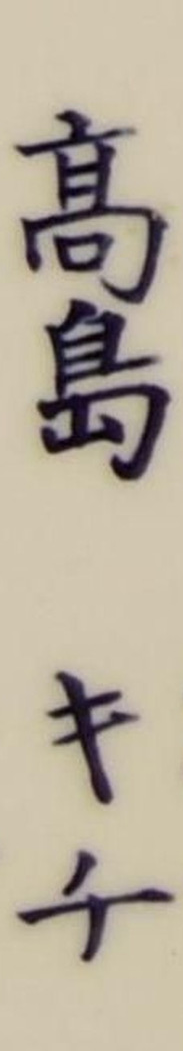高島キチ
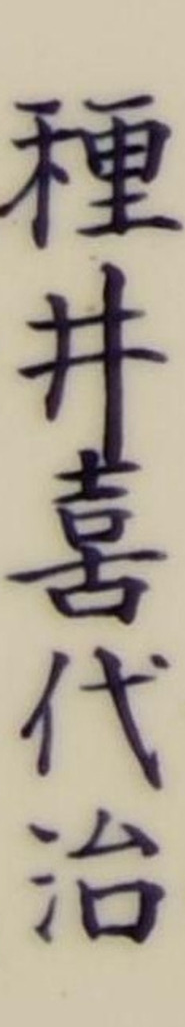種井喜代治
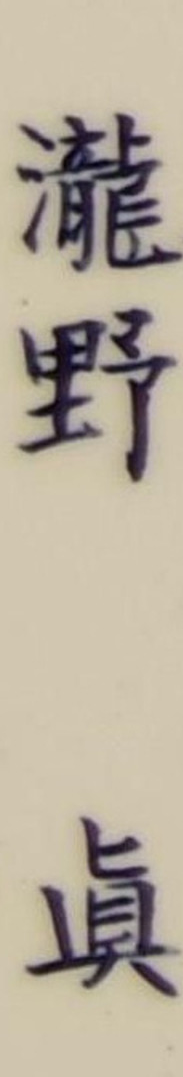瀧野眞
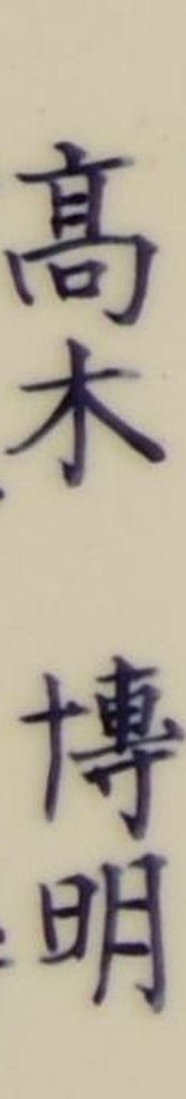高木博明

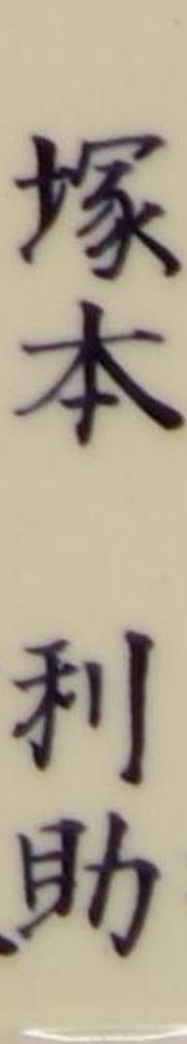塚本利助
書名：A~D
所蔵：koyasan kongobuji
